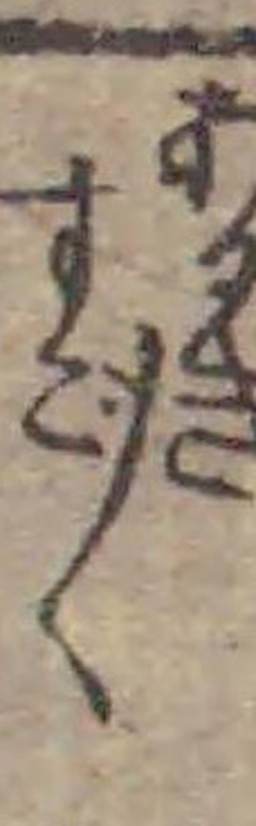すご〳〵
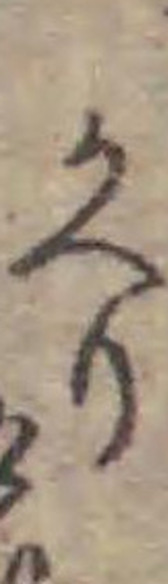かへり
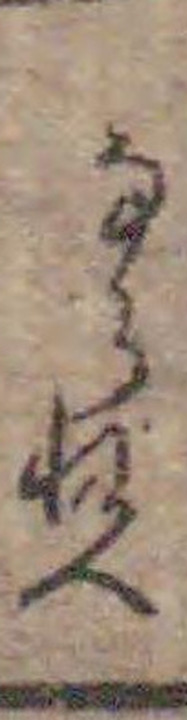ならねへ
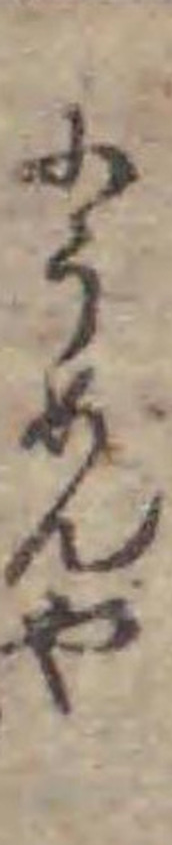にうめんや
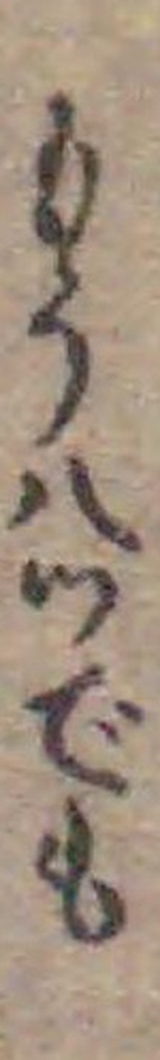もう八つでも
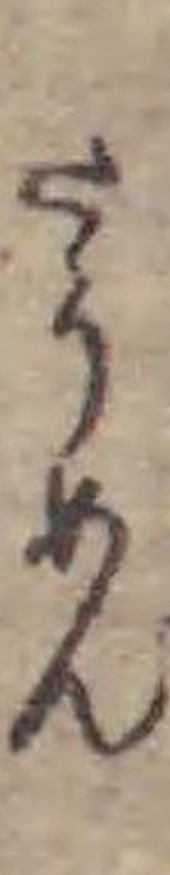たうめん
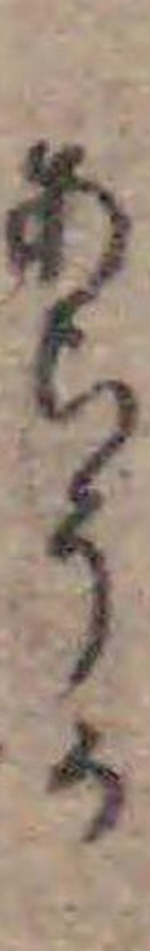あらうか
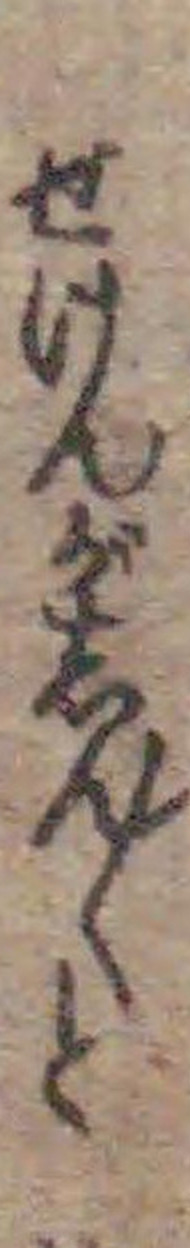せけんがしん〳〵と

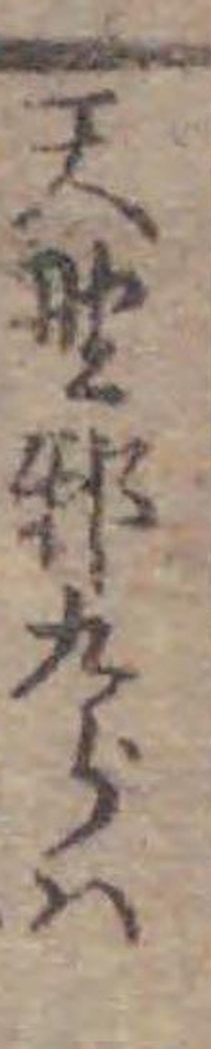天野邪九郎は
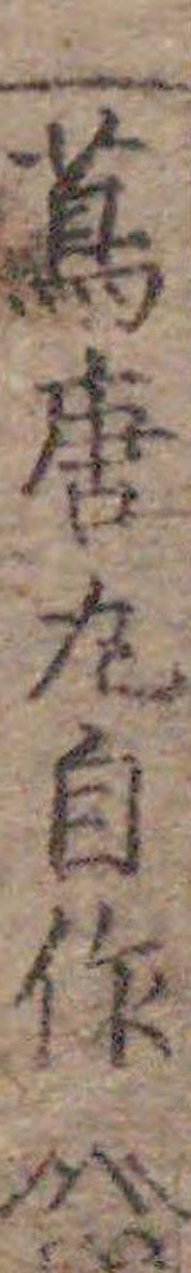蔦唐丸自作
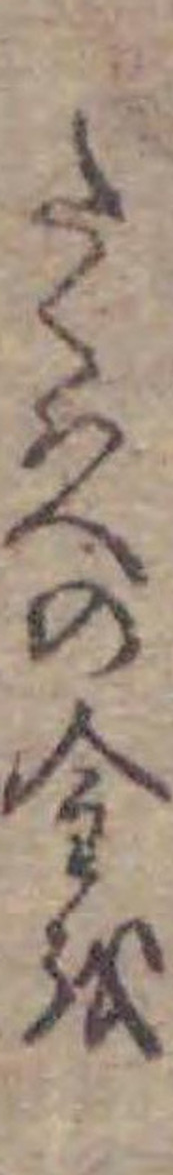たくはへの金を
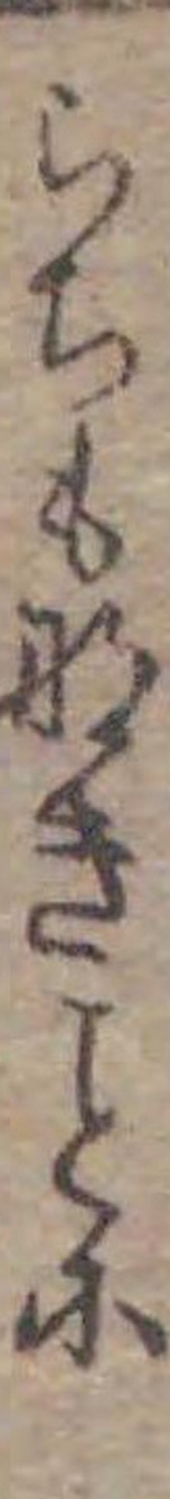らちもなきことに
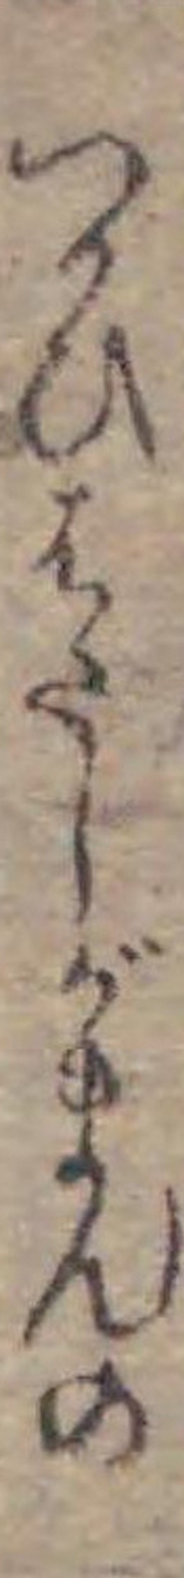つかひはたしがまんの
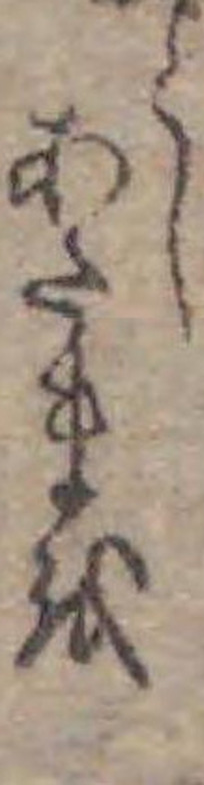あたまを
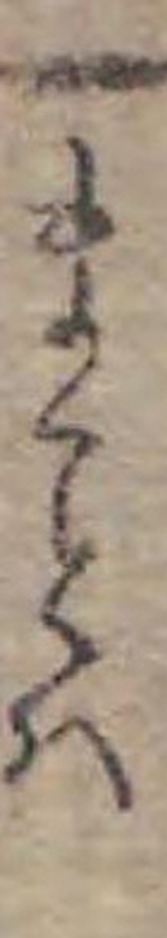まことは
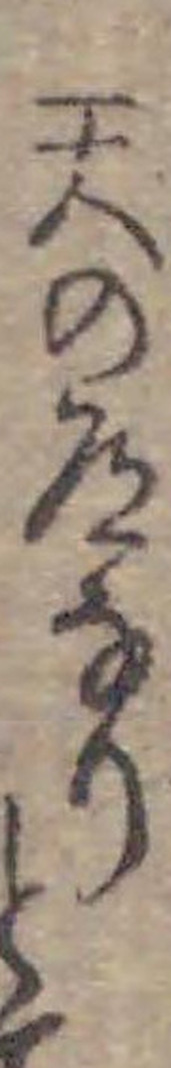天の道なり
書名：本樹真猿浮気噺 : 3巻
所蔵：国立国会図書館 National Diet Library, JAPAN
